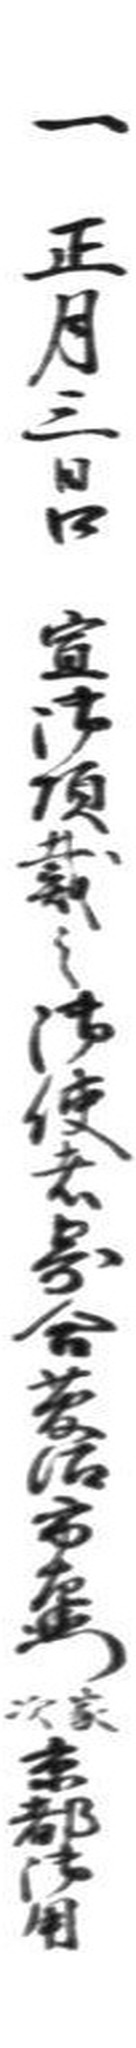一正月三日口宣御頂戴之御使者寄合菅沼市左衛門家次京都御用
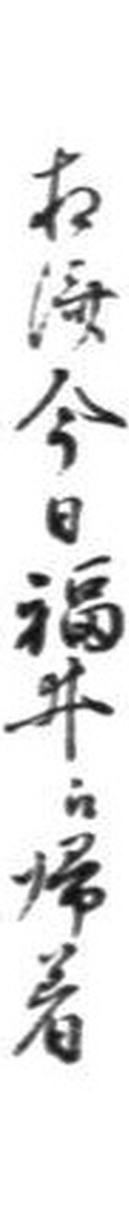相済今日福井江帰着
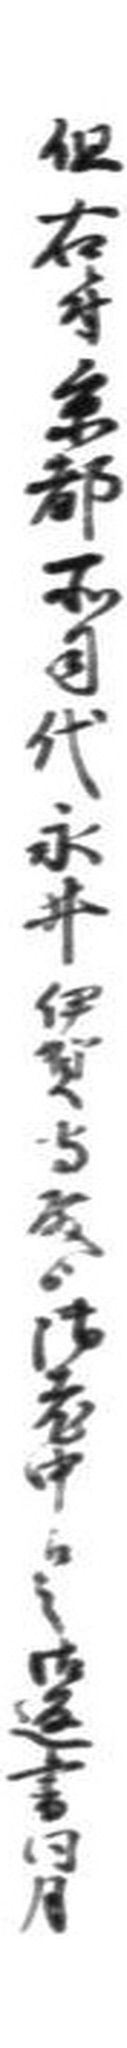但右ニ付京都所司代永井伊賀守殿ゟ御老中江之御返書同月
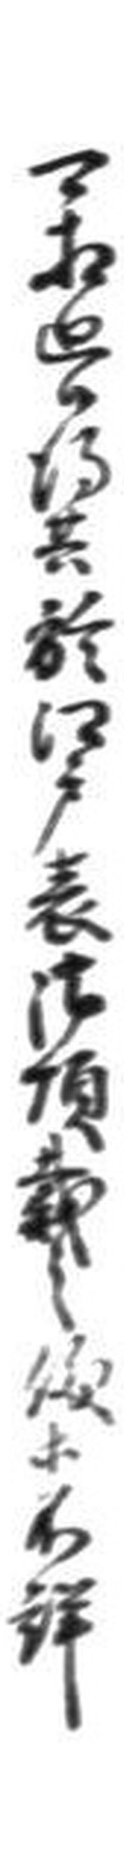可相廻候得共於江戸表御頂戴之儀等不詳
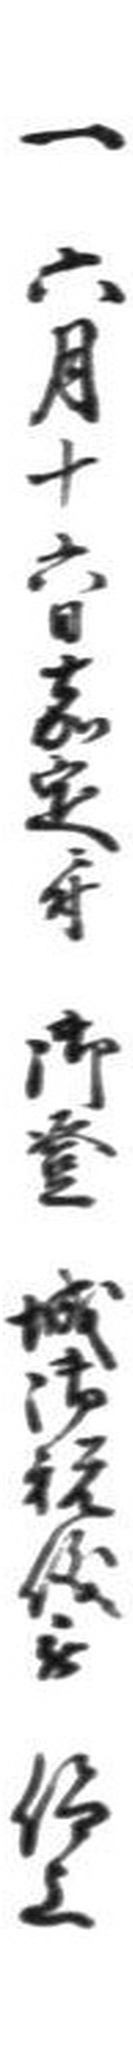一六月十六日嘉定ニ付御登城御祝儀被仰上

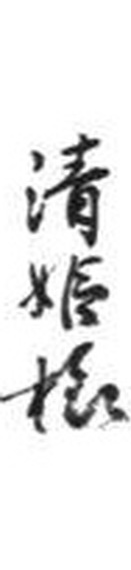清姫様
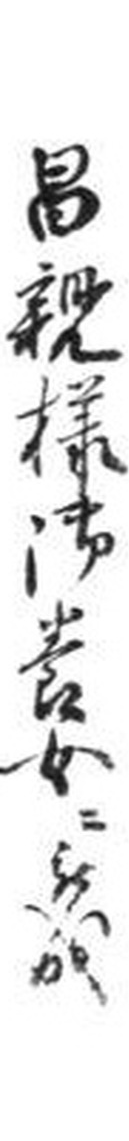昌親様御養女ニ被成
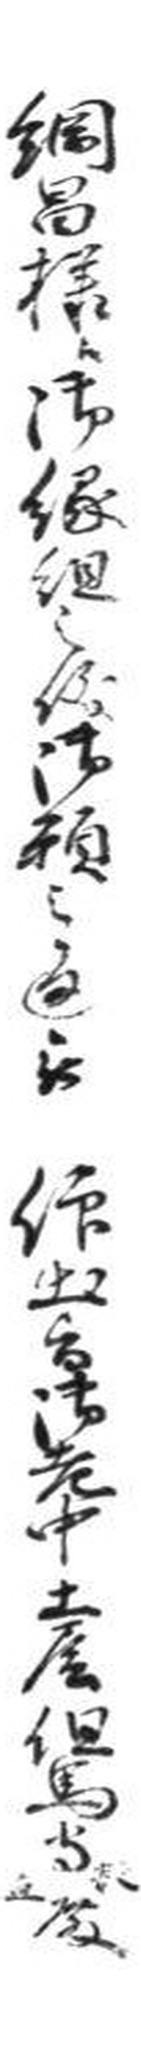綱昌様江御縁組之儀御頼之通被仰出旨土屋但馬守数直殿
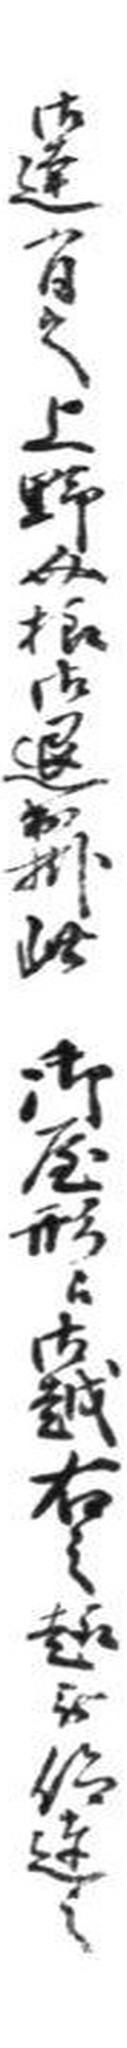御達有之上野介様御退出掛此御屋形江御越右之趣被仰達之
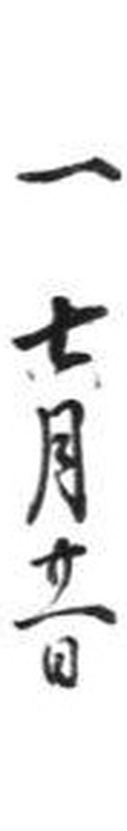一七月廿一日
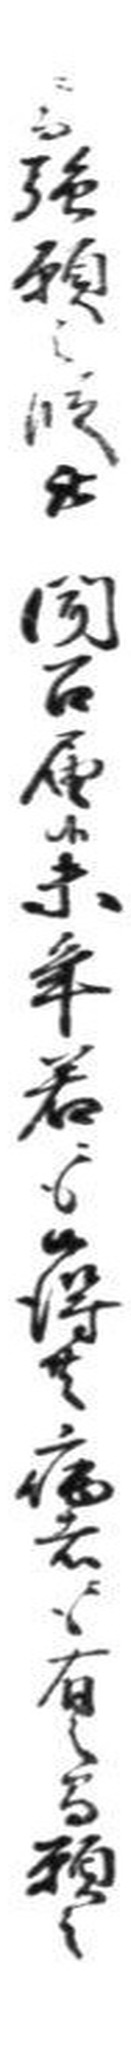ニ而強願之段被聞召届候未年若ニも候得共病者ニも有之間願
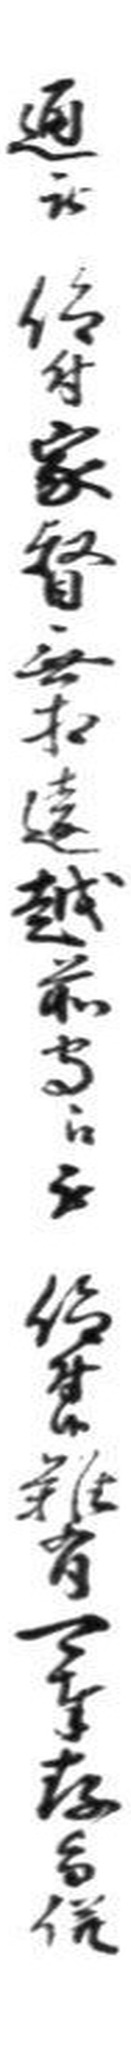通被仰付家督無相違越前守江被仰付候難有可奉存旨併
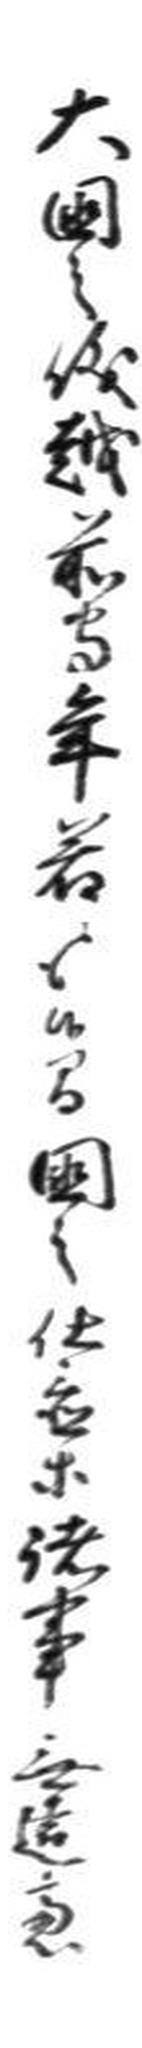大国之儀越前守年若ニも候間国之仕置等諸事無遠慮
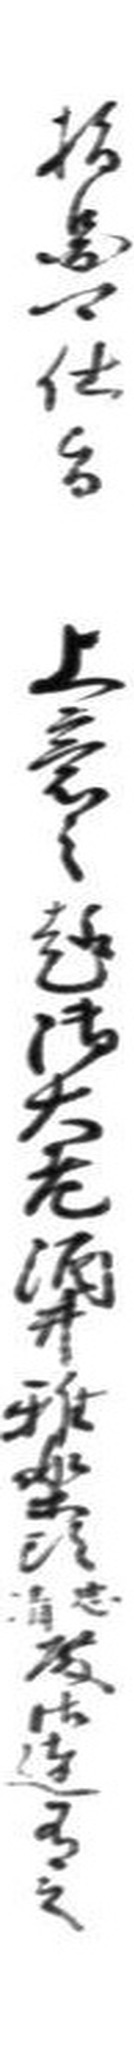指図可仕旨上意之趣御大老酒井雅楽頭忠清殿御達有之
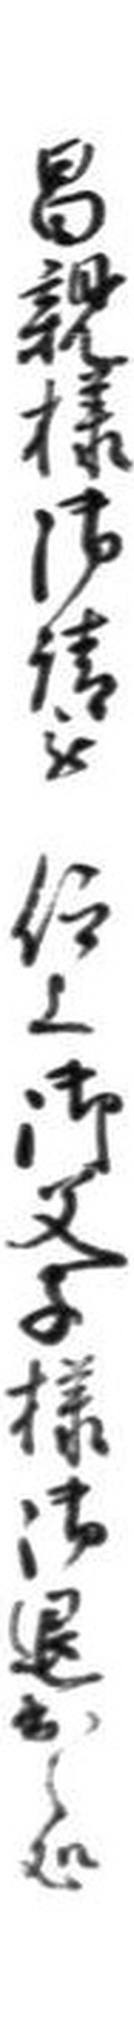昌親様御請被仰上御父子様御退出之処
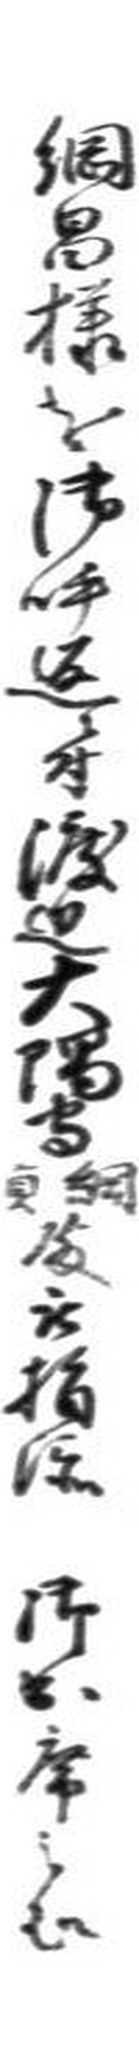綱昌様を御呼返ニ付渡辺大隅守綱貞殿被指添御出席之処
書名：家譜 十三 綱昌公 従寛文元年到延宝五年
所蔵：福井県文書館 Fukui Prefectural Archives
